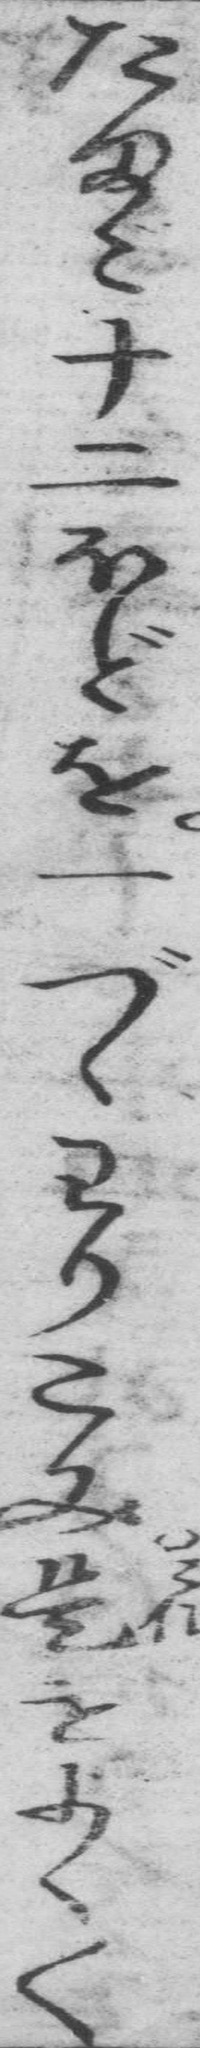たまご十二ほどを。一づゝわりこみ。是もよく〳〵
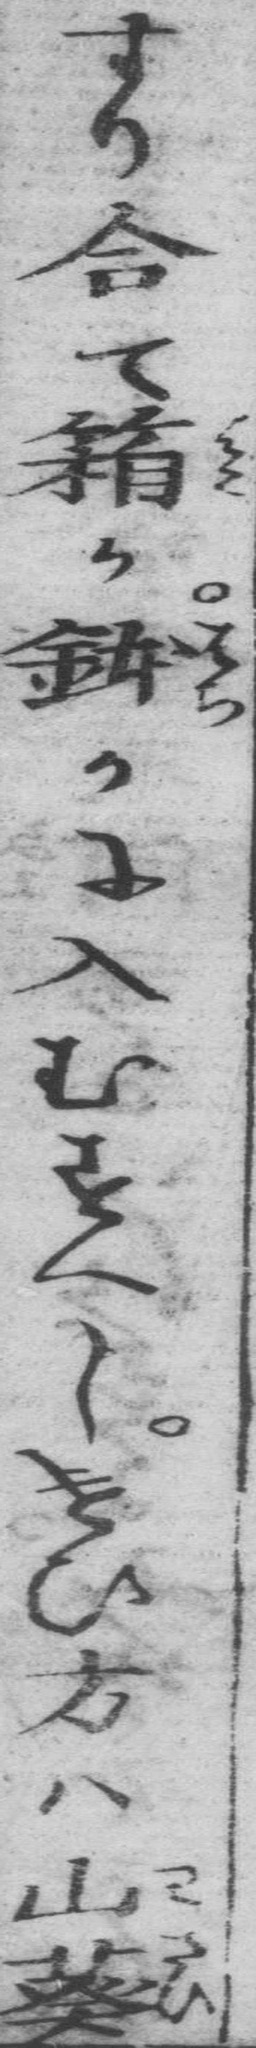すり合て箱か。鉢かに入むすへし。遣ひ方は山葵

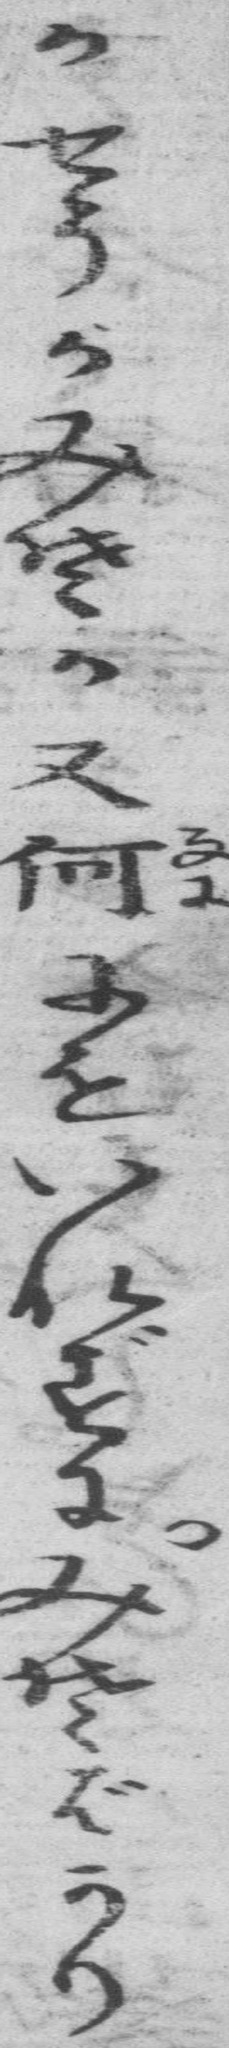かせうかみそか又何にもいれずに。みそばかり
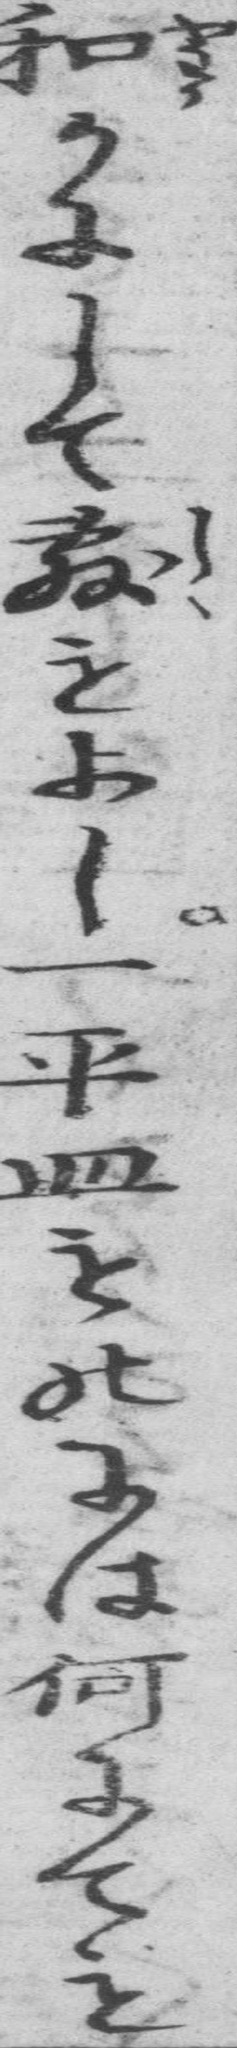和かにして敷もよし。一平皿ものには何にても
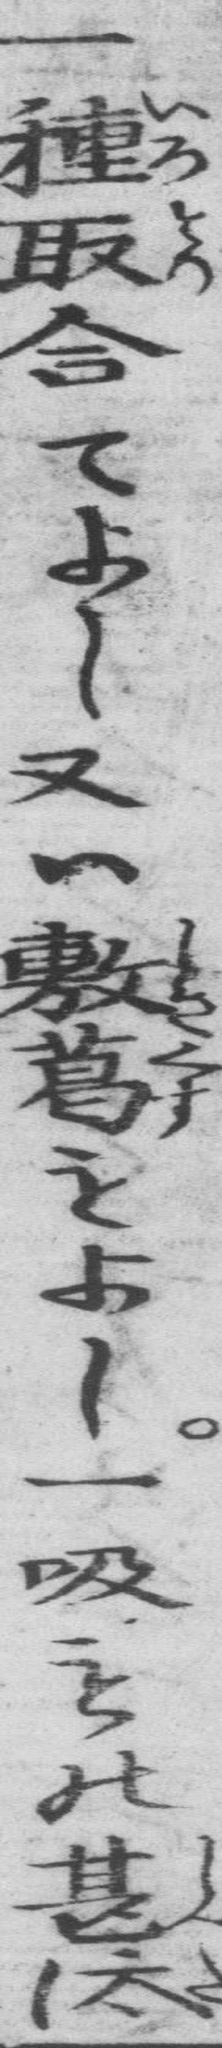一種取合てよし又は敷葛もよし。一吸もの甚汰
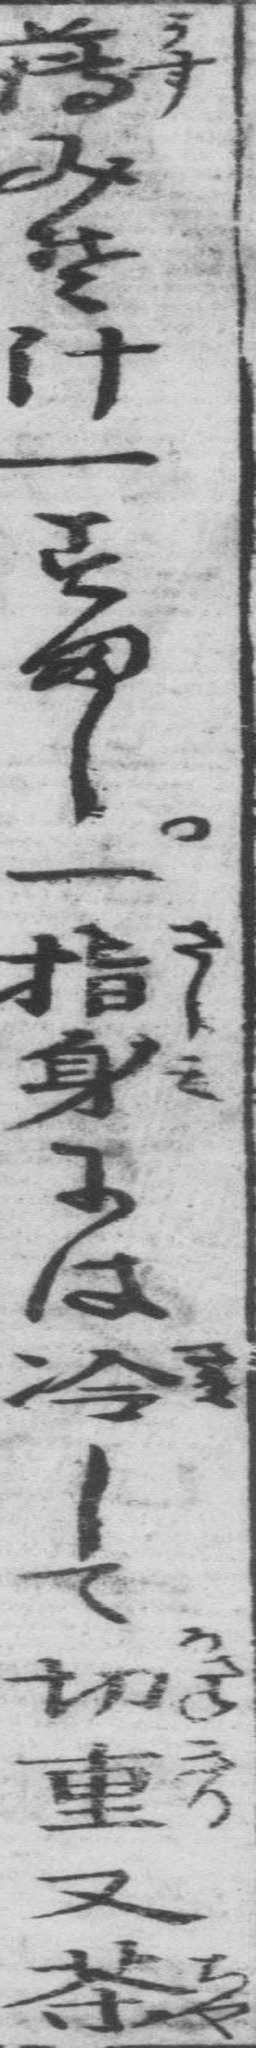薄みそ汁一すまし。一指身には冷して切重又茶
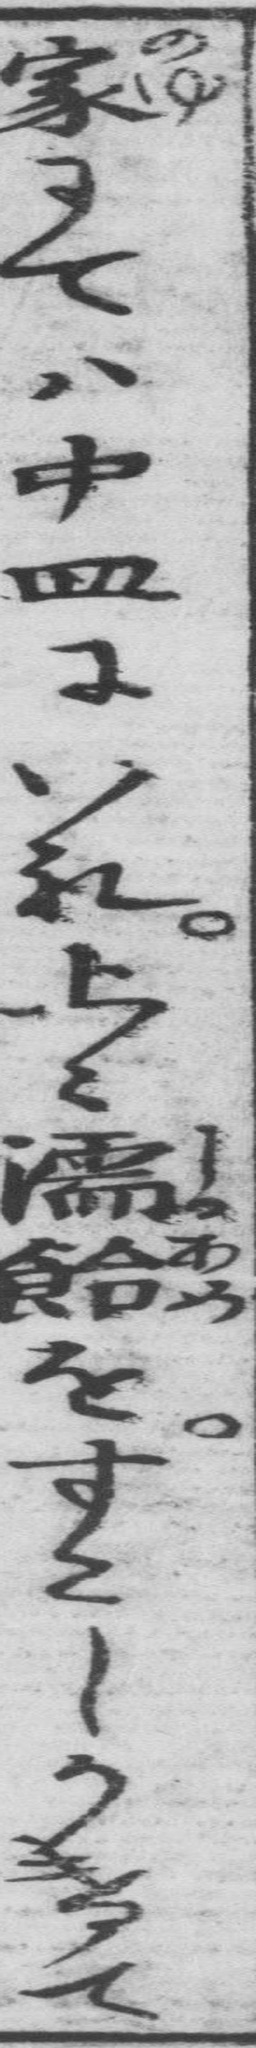家にては中皿にいれ。上々濡飴を。すこしかけて
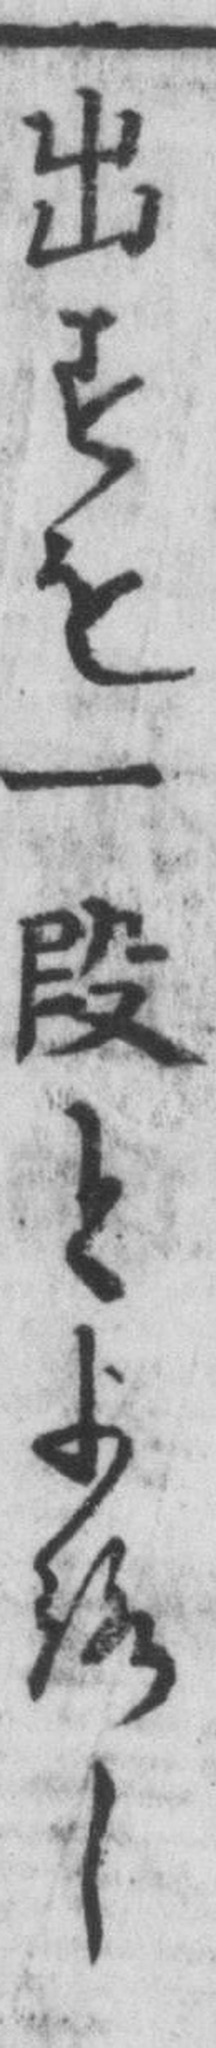出すも一段とよろし
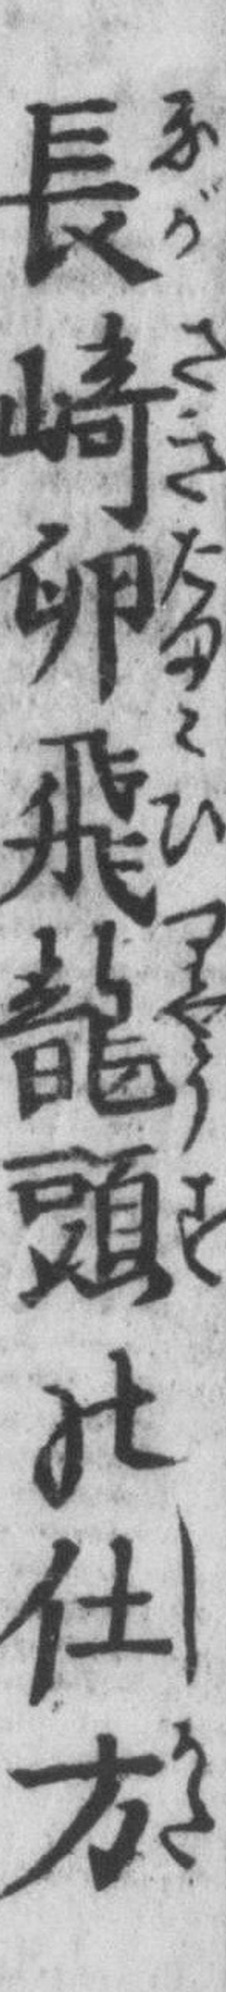長崎卵飛竜頭の仕方
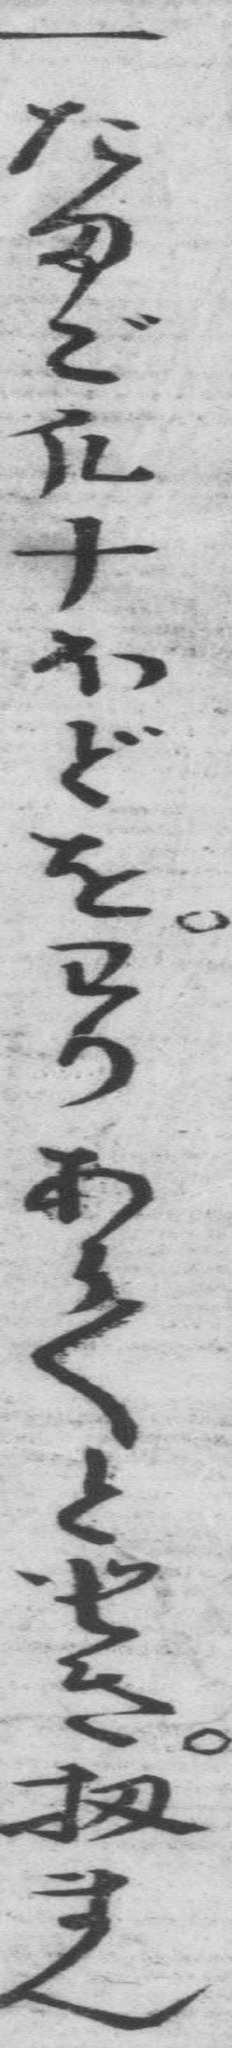一たまご凡十ほどを。わりあら〳〵ととき、扨まん
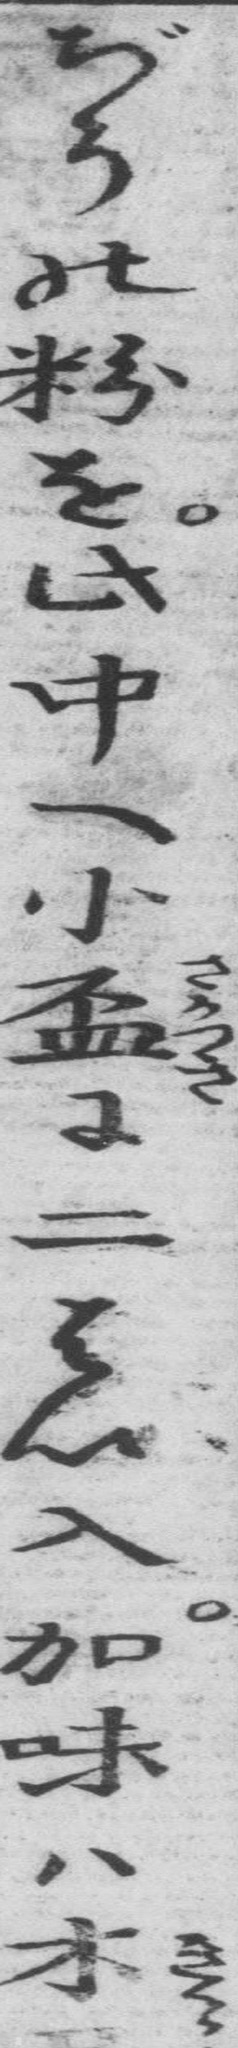ぢうの粉を。此中へ小盃に二はい入。加味は木耳
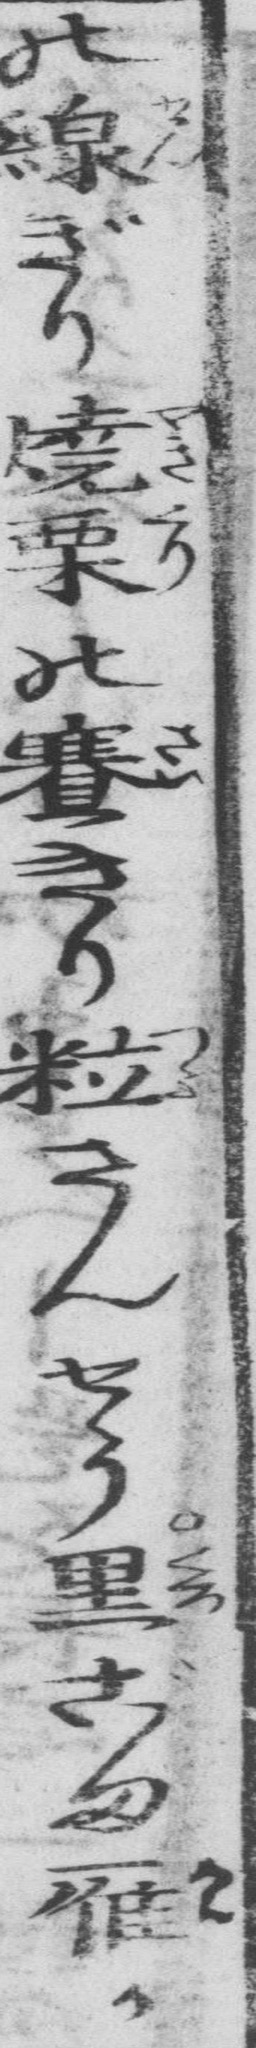の線ぎり焼栗の賽きり粒さんせう。黒ごま雁か
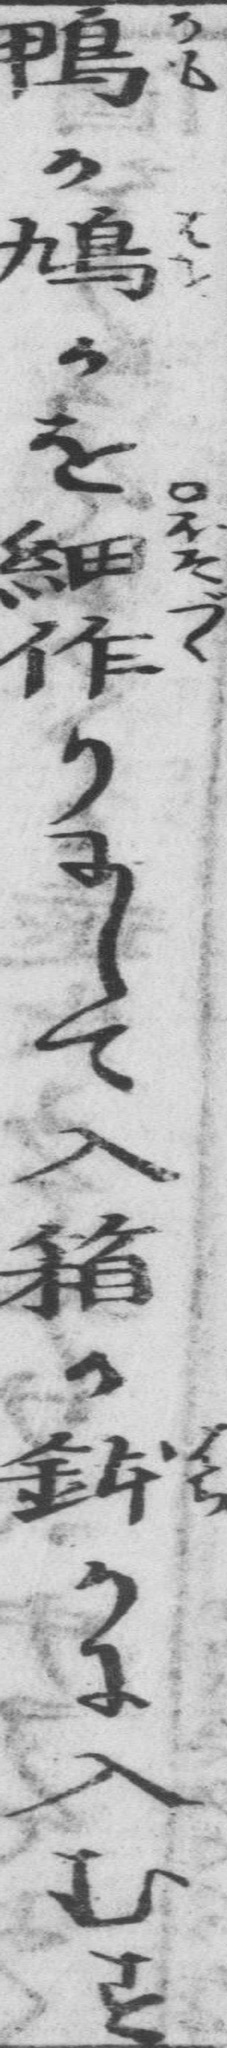鴨か鳩かを。細作りにして入箱か鉢かに入むす
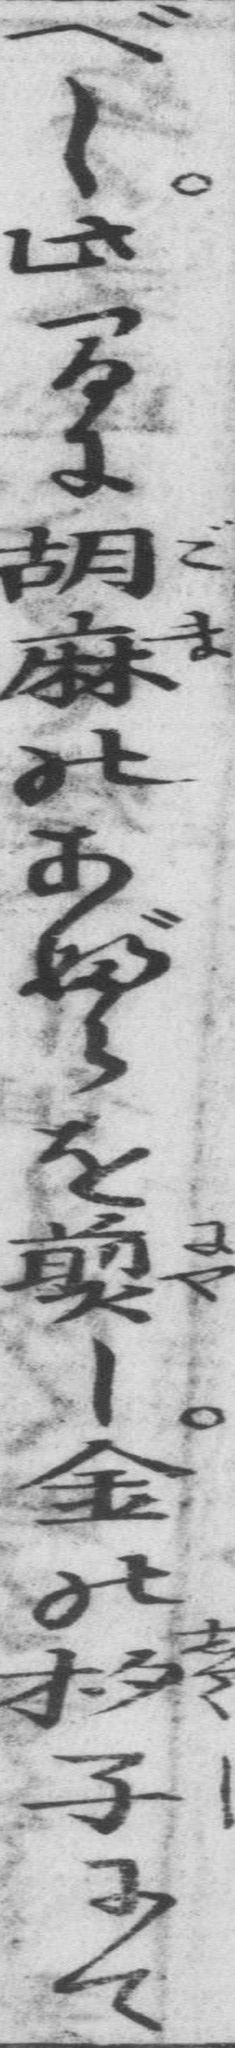べし。此間に胡麻のあぶらを煎し。金の杓子にて
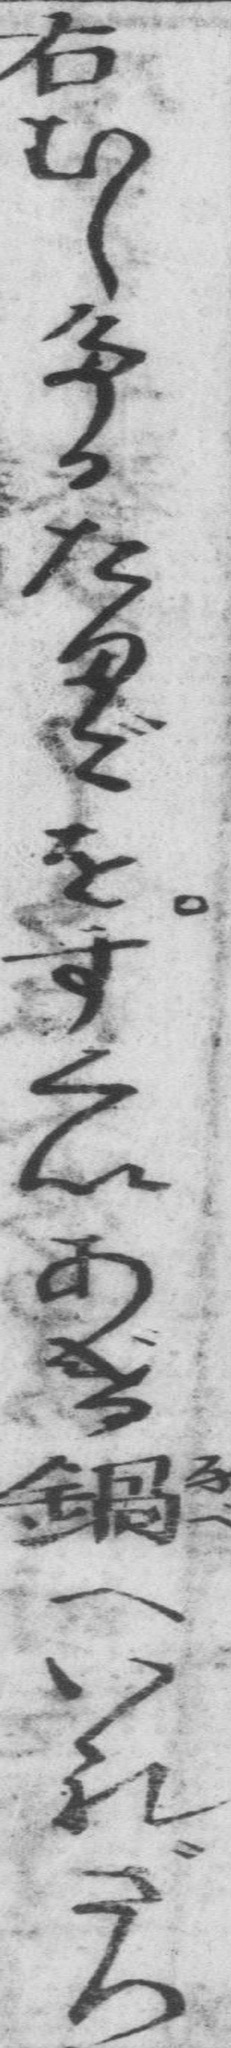右むしたるたまごを。すくいあげ鍋へいれざつ
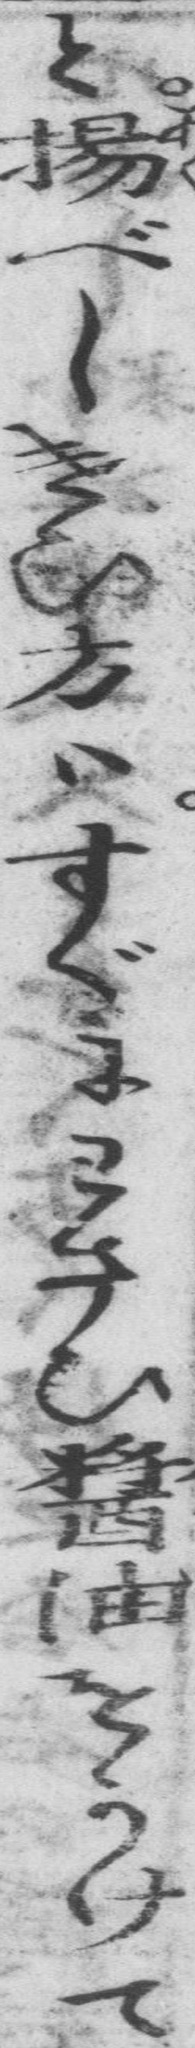と揚べし遣ひ方は。すぐにわさひ醤油をかけて
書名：萬寳料理秘密箱
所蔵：大阪府立大学学術情報センター 国文学研究資料館
